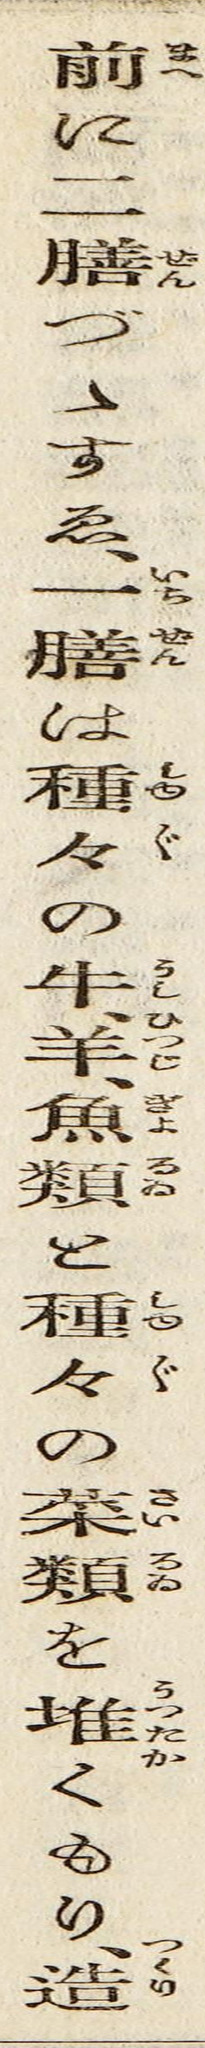前に二膳づゝすゑ、一膳は種々の牛、羊、魚類と種々の菜類を堆くもり、造
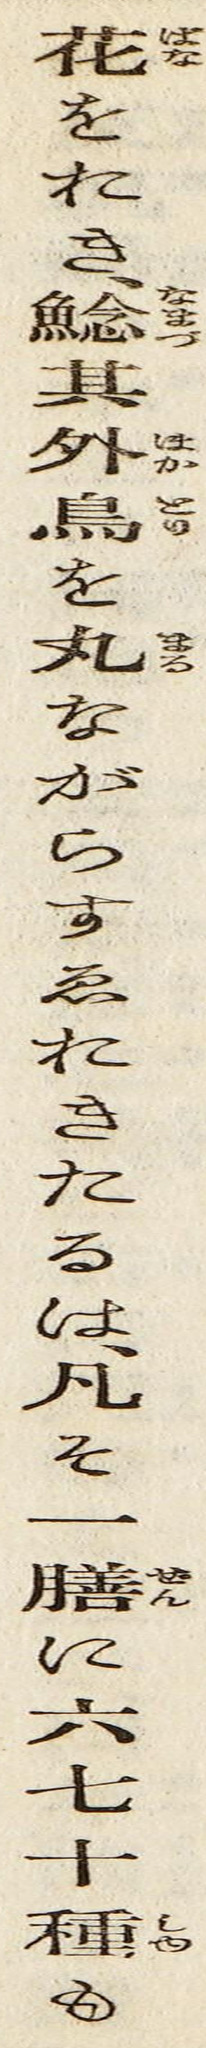花をおき、鯰其外鳥を丸ながらすゑおきたるは、凡そ一膳に六七十種も
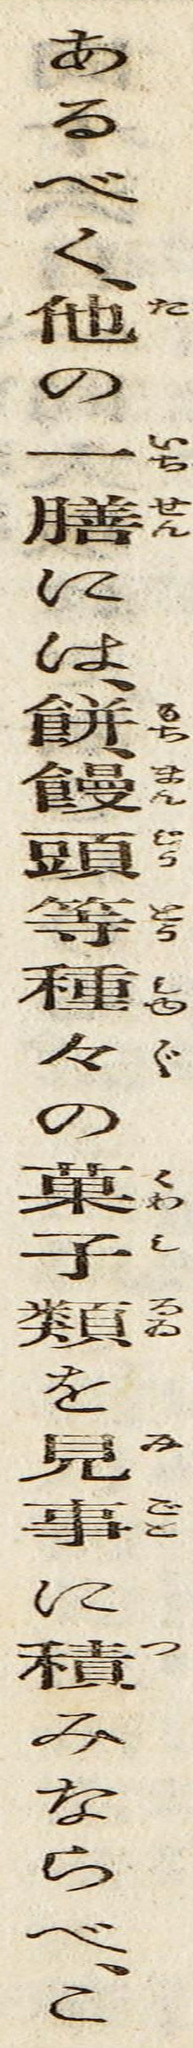あるべく、他の一膳には、餅、饅頭等種々の菓子類を見事に積みならべ、こ
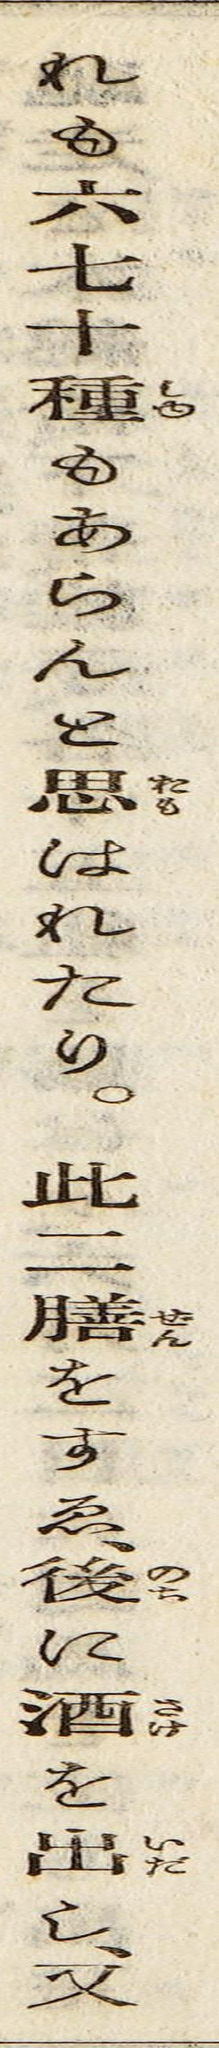れも六七十種もあらんと思はれたり。此二膳をすゑ、後に酒を出し、又
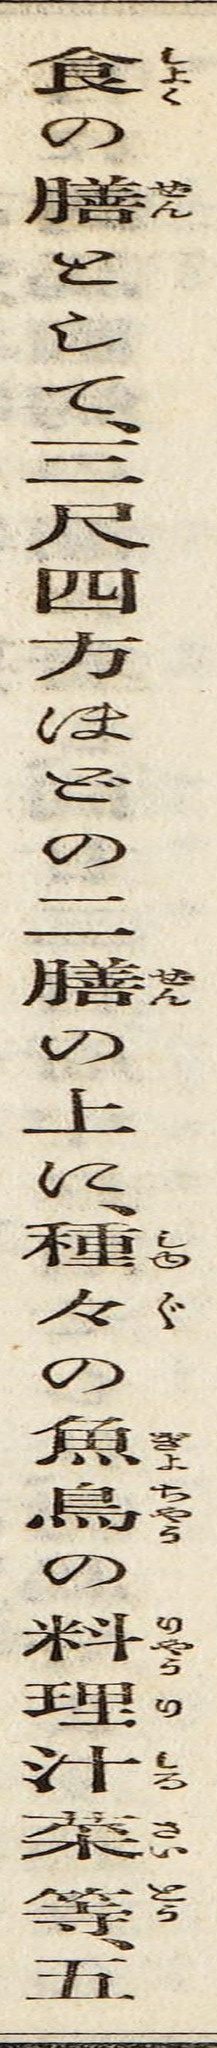食の膳として、三尺四方ほどの二膳の上に、種々の魚鳥の料理汁菜等、五
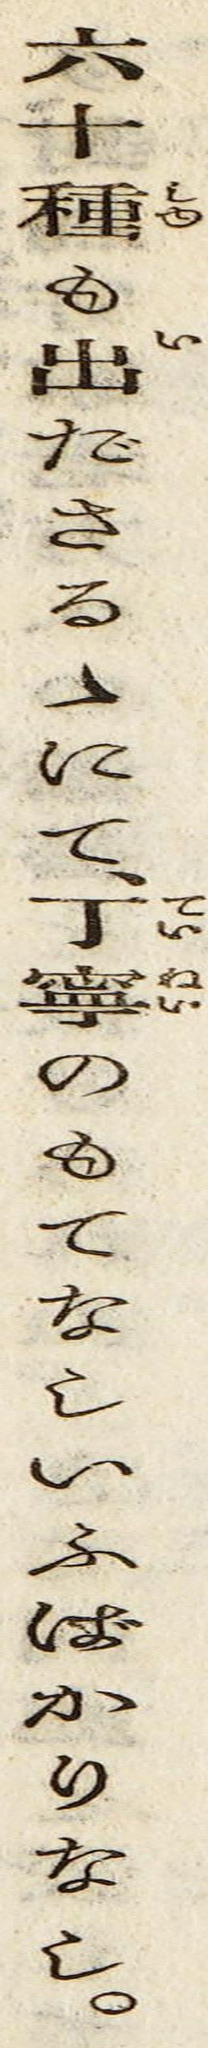六十種も出ださるゝにて、丁寧のもてなしいふばかりなし。
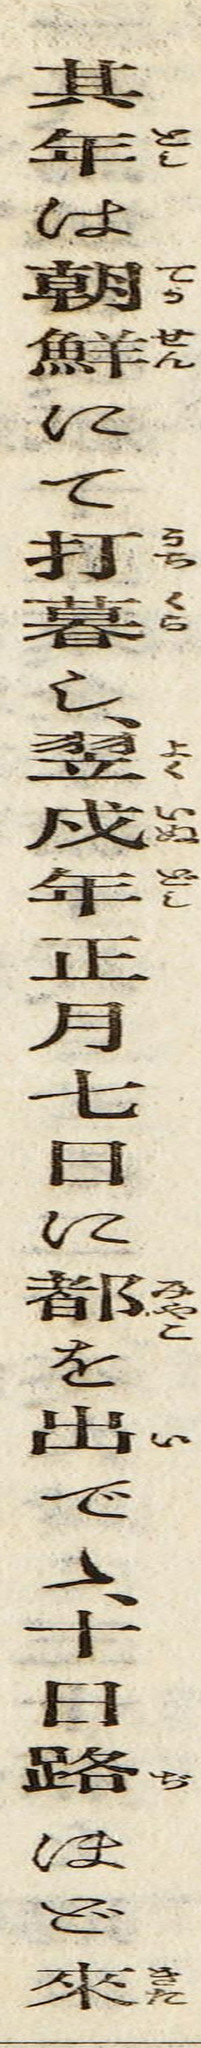其年は朝鮮にて打暮し、翌戌年正月七日に都を出でゝ、十日路ほど来
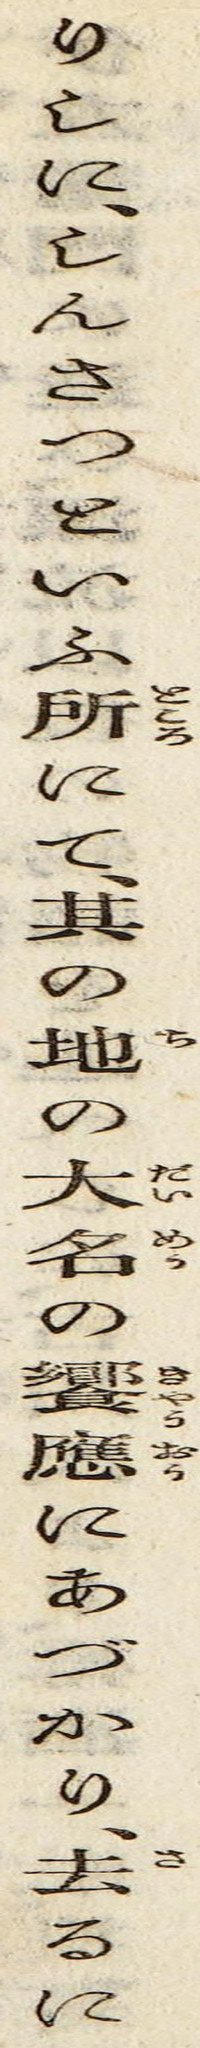りしに、しんさつといふ所にて、其の地の大名の饗応にあづかり、去るに
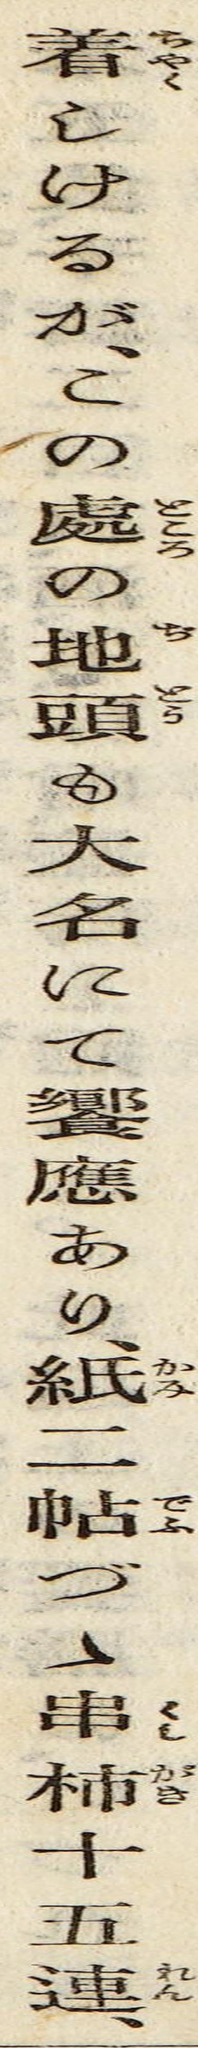着しけるが、この処の地頭も大名にて饗応あり、紙二帖づゝ串柿十五連、

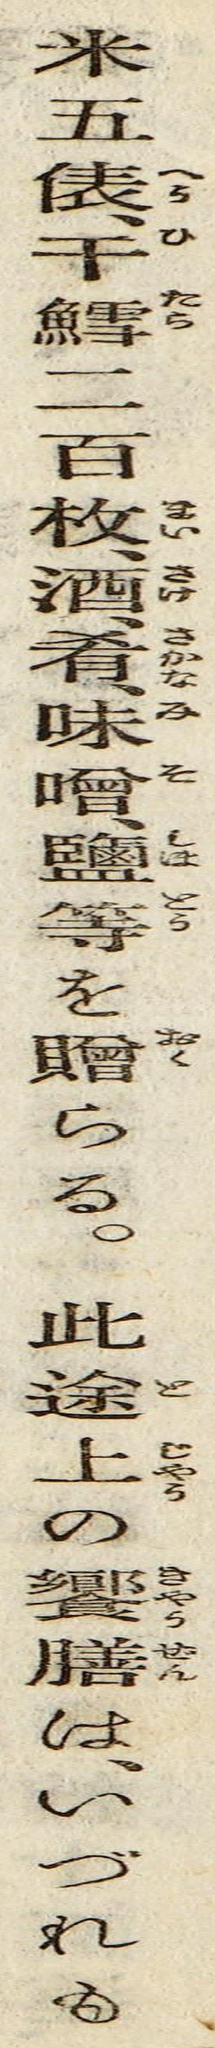米五俵、干鱈二百枚、酒、肴、味噌、塩等を贈らる。此途上の饗膳は、いづれも
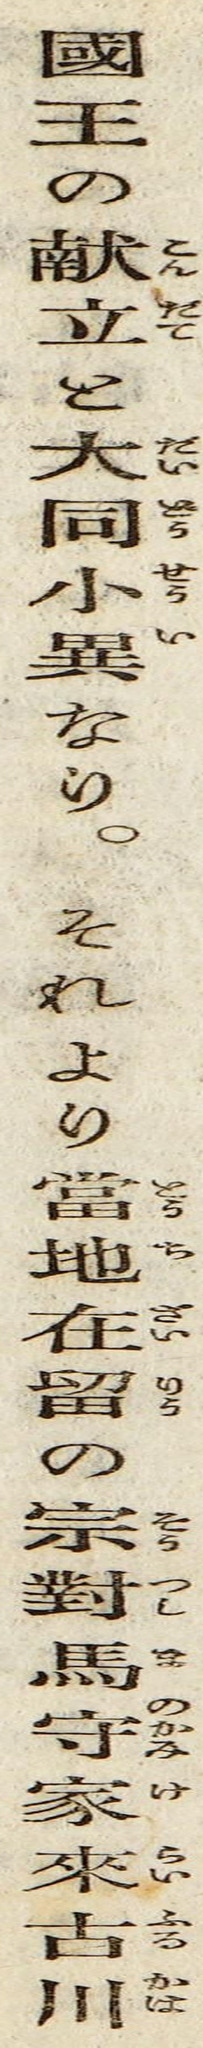国王の献立と大同小異なり。それより当地在留の宗対馬守家来古川
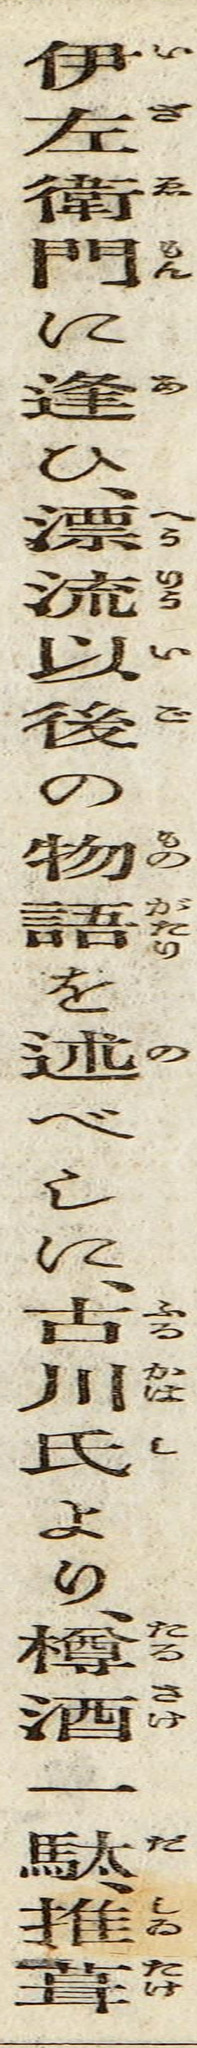伊左衛門に逢ひ、漂流以後の物語を述べしに、古川氏より、樽酒一駄、推葺
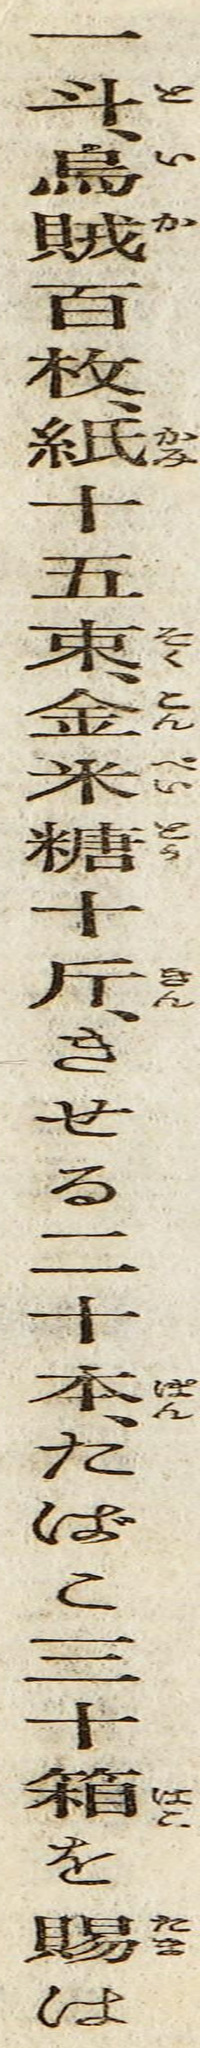一斗、烏賊百枚、紙十五束、金米糖十斤、きせる二十本、たばこ三十箱を賜は
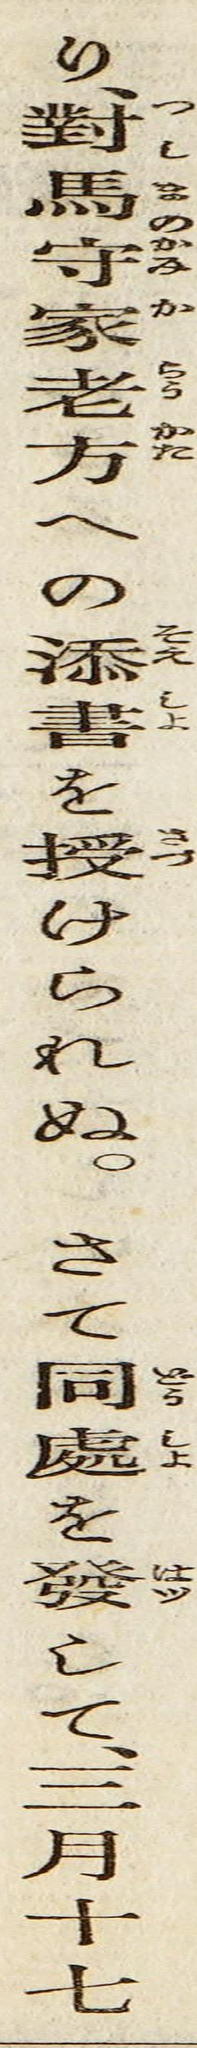り、対馬守家老方への添書を授けられぬ。さて同処を発して、三月十七
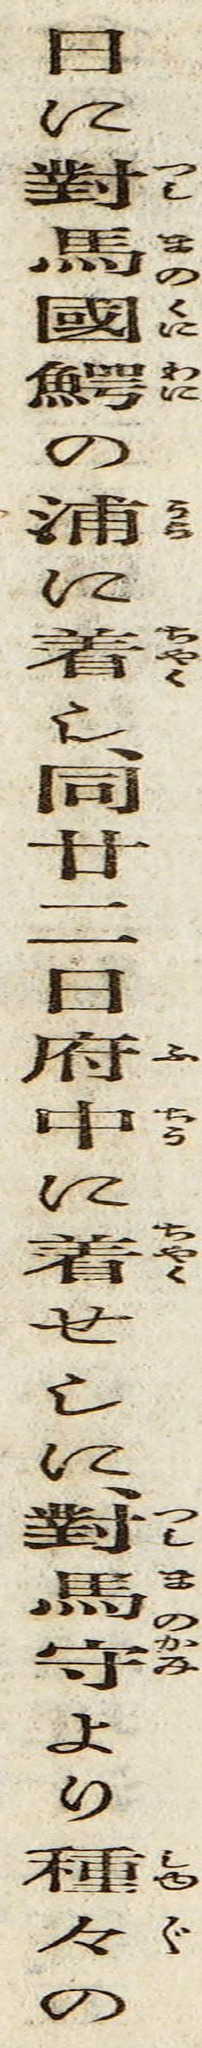日に対馬国鰐の浦に着し、同廿二日府中に着せしに、対馬守より種々の
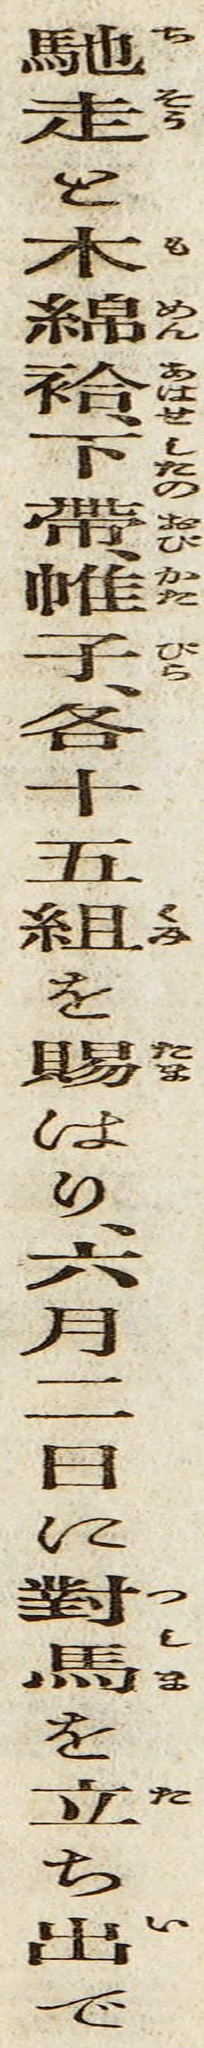馳走と木綿袷、下帯、帷子、各十五組を賜はり、六月二日に対馬を立ち出で
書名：日本漂流譚
